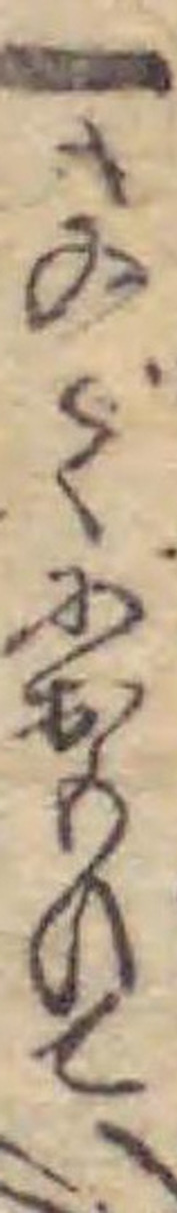きのどくにおもひて
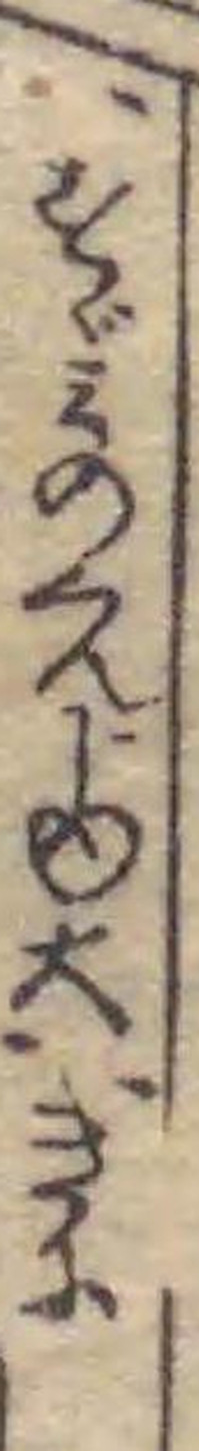すゞみのくんじゆ大きに
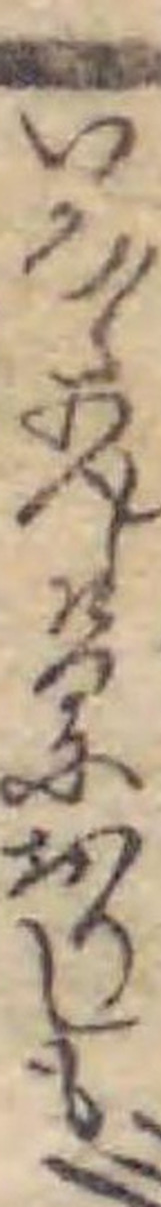いろ〳〵あんしけるにおりしも
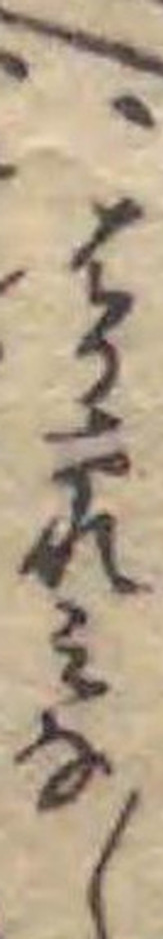はかされみな〳〵
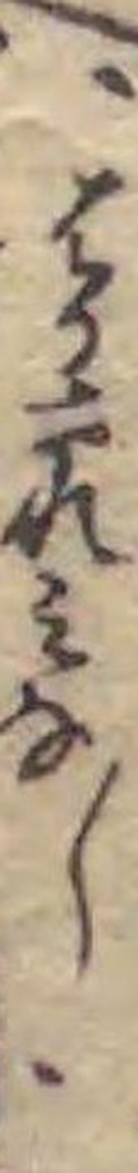はかされみな〳〵
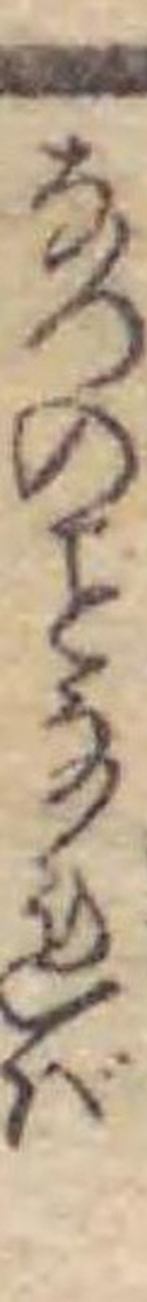なつのことなれば
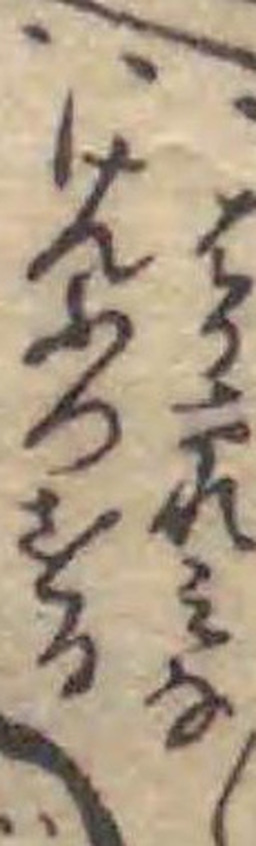けんふつする
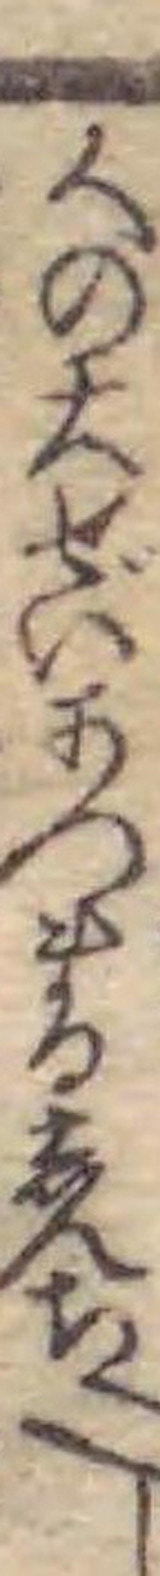人の大ぜいあつまるしんち
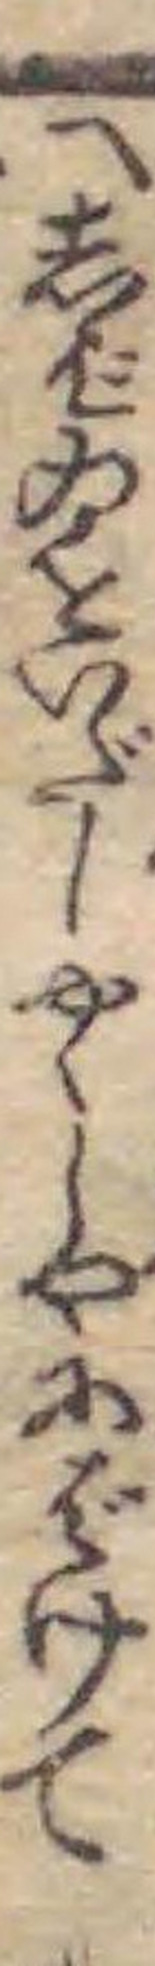へしばゐをいだしやくしやにばけて
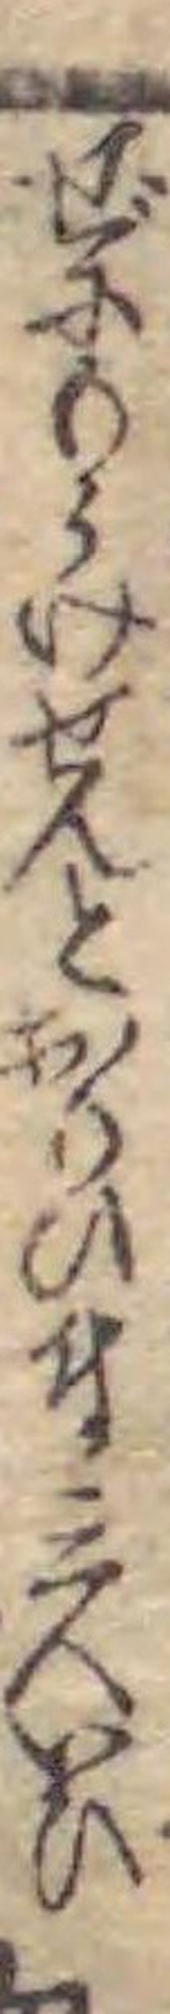ぜにもふけせんとおもひ付三人いひ
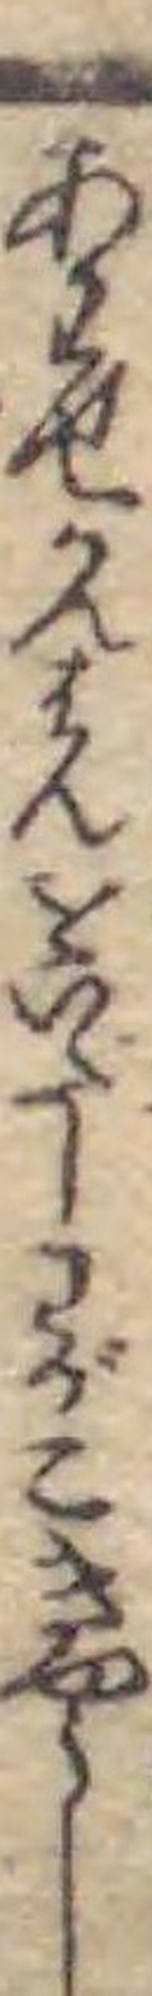あわせかんはんをいたしわがこきやう
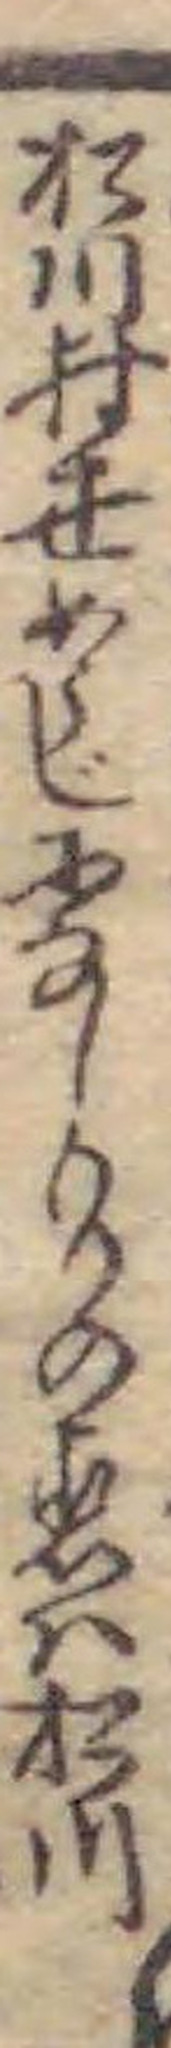松川村をめうじになしもりの丞は松川
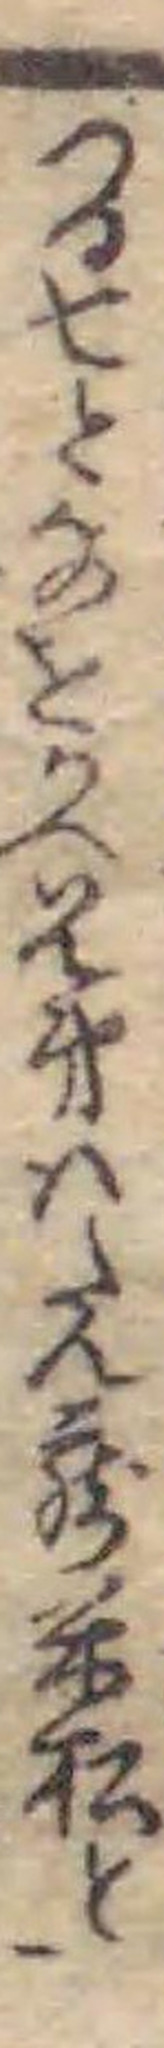つる七となをかへ兄弟はたん蔵米松と
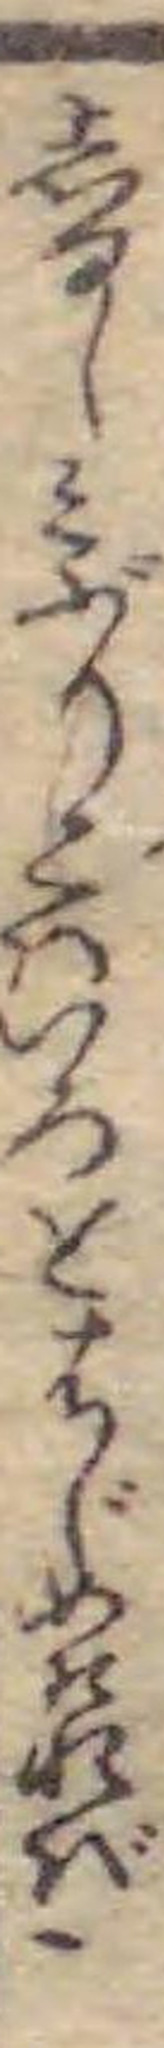しるしみぶりこはいろとはじめければ
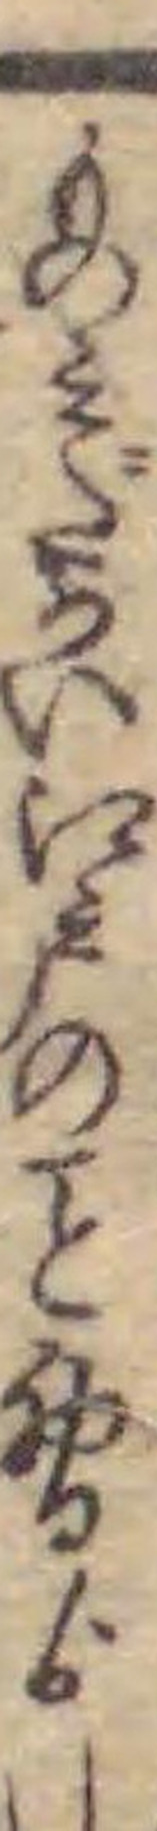ものみだかい江戸のこと初日より
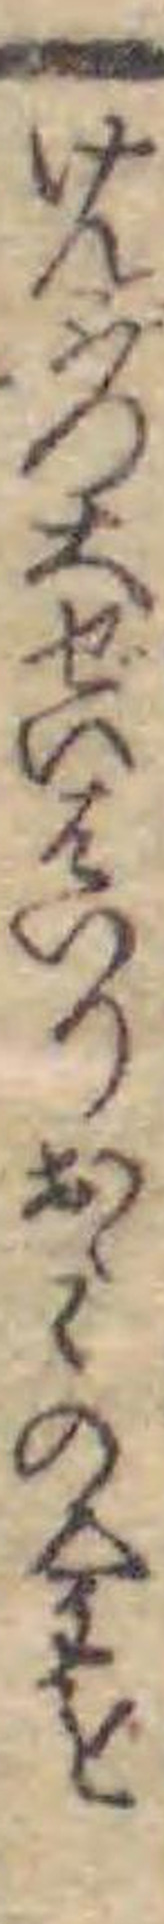けんぶつ大ぜいはいりおゝくの金を
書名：扨化狐通人 : 2巻
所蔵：国立国会図書館 National Diet Library, JAPAN
